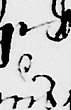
i¬
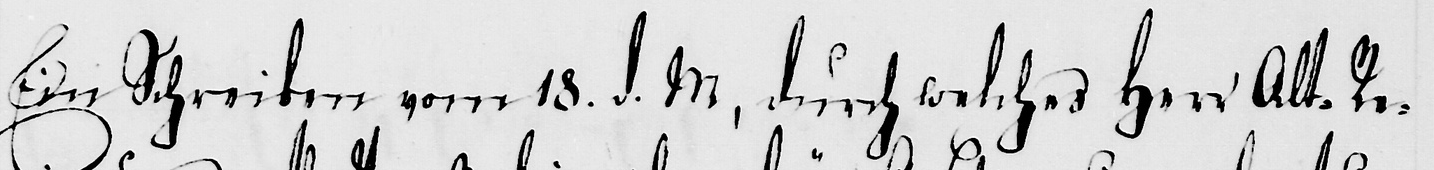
Ein Schreiben vom 18. d. M, durch welches Herr Alt-Re¬
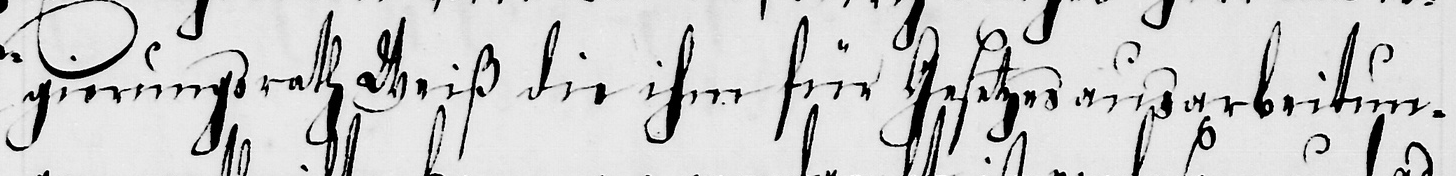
gierungsrath Weiß die ihm für Gesetzesausarbeitun¬
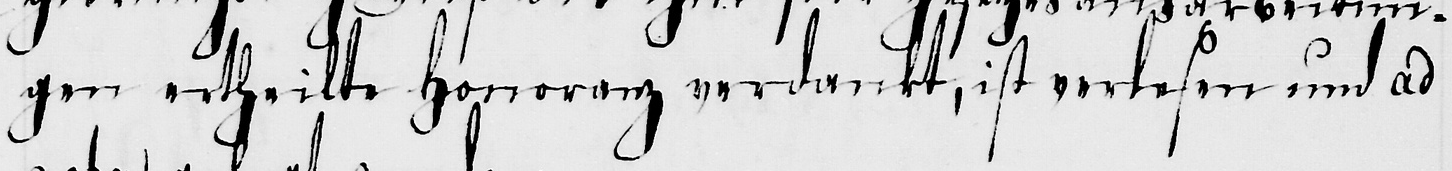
gen ertheilte Honoranz verdankt, ist verlesen und ad
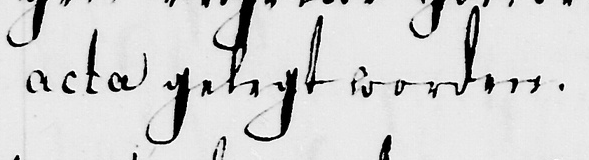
acta gelegt worden.
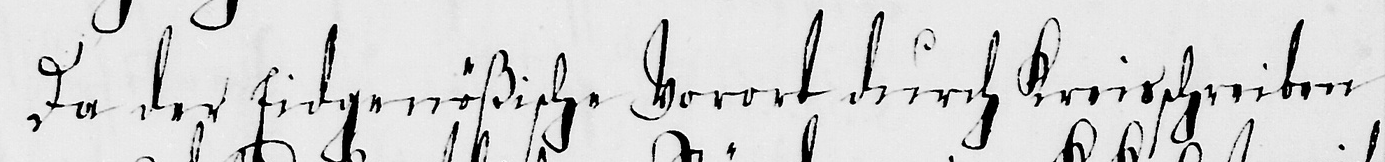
Da der Eidgenößische Vorort durch Kreisschreiben
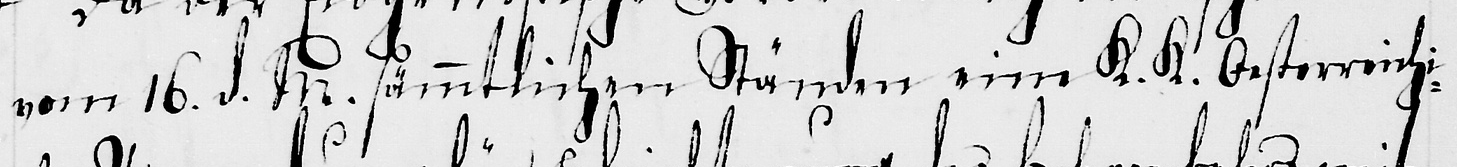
vom 16. d. M. sämmtlichen Ständen eine K. K. Oesterreich¬
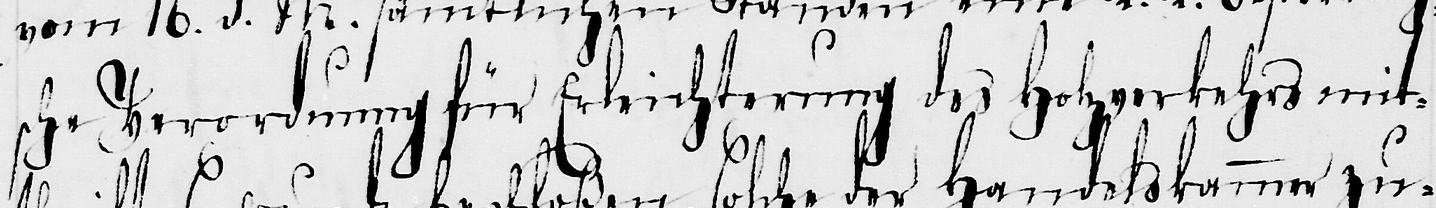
sche Verordnung für Erleichterung des Holzverkehrs mit¬
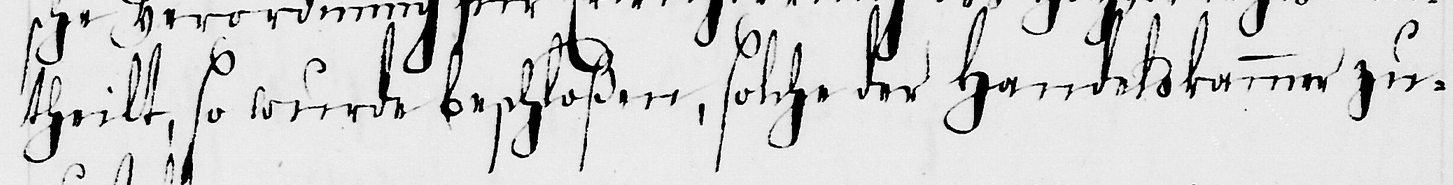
theilt, so wurde beschloßen, solche der Handelskammer zu¬
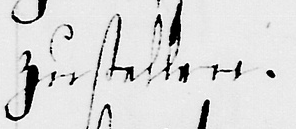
zustellen.
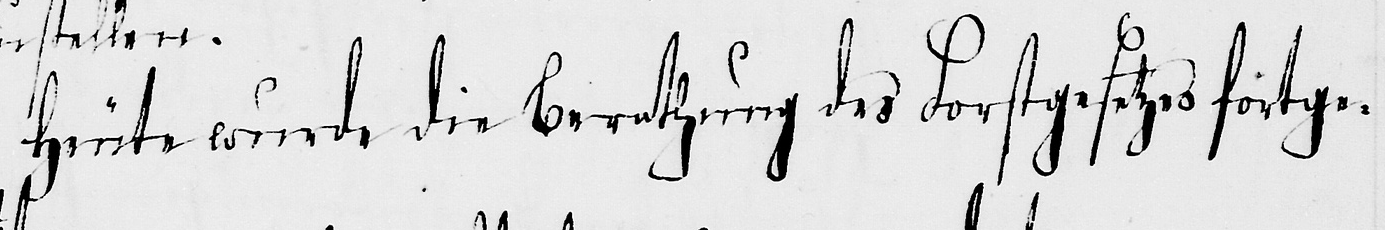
Heute wurde die Berathung des Forstgesetzes
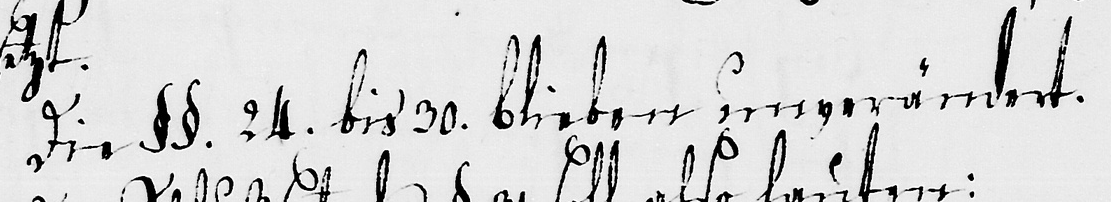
Die §§. 24. bis 30. blieben unverändert.
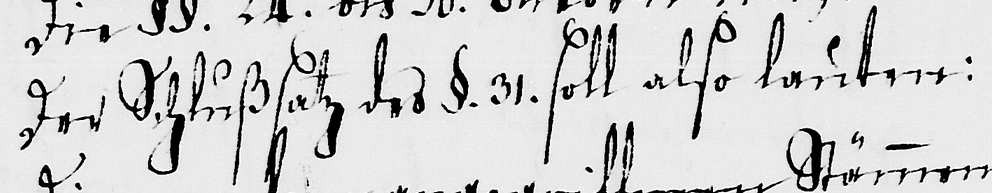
Der Schlußsatz des §.31. soll also lauten:
